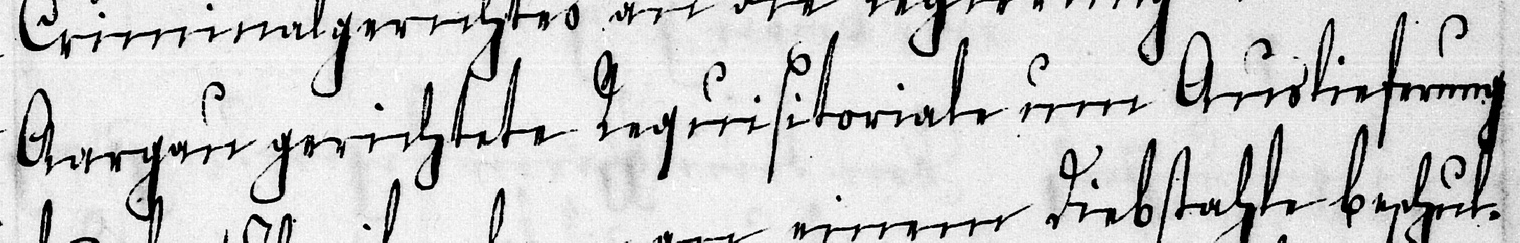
Aargau gerichtete Requisitoriale um Auslieferung
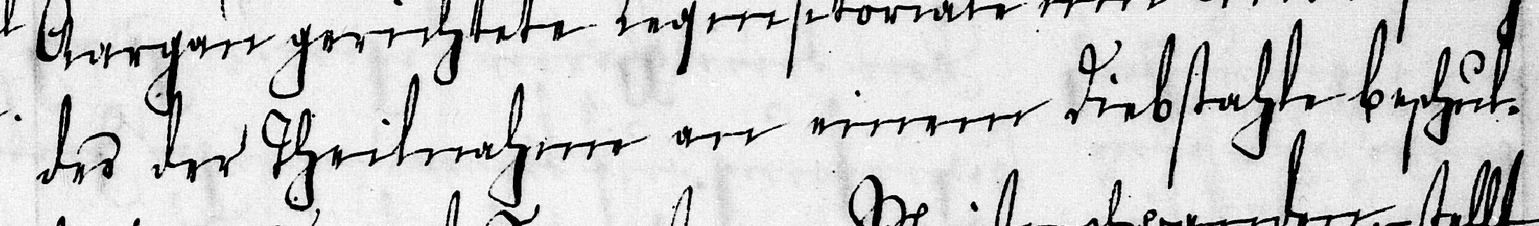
des der Theilnahme an einem Diebstahle beschul¬
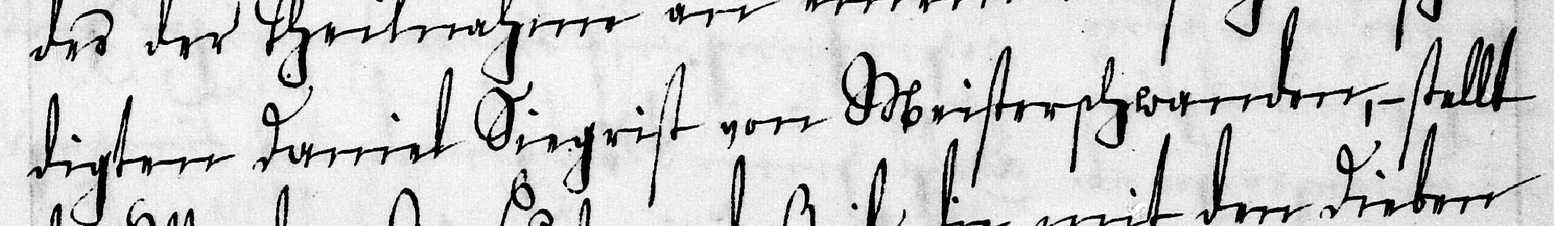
digten Daniel Siegrist von Meisterschwanden, – stellt
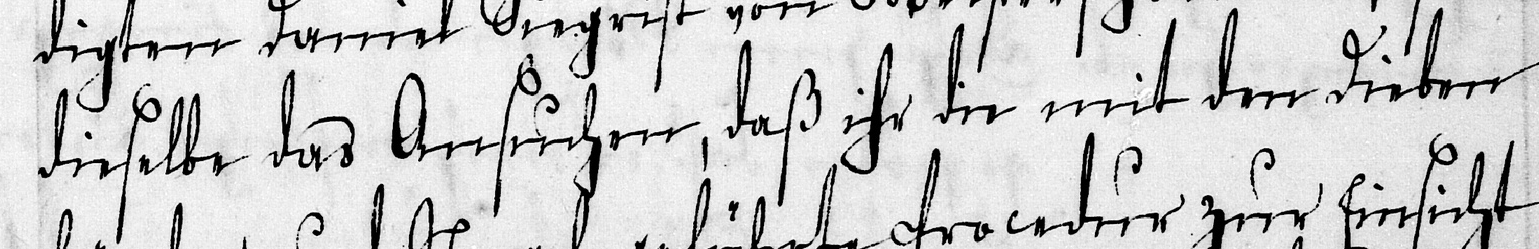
dieselbe das Ansuchen, daß ihr die mit den Dieben
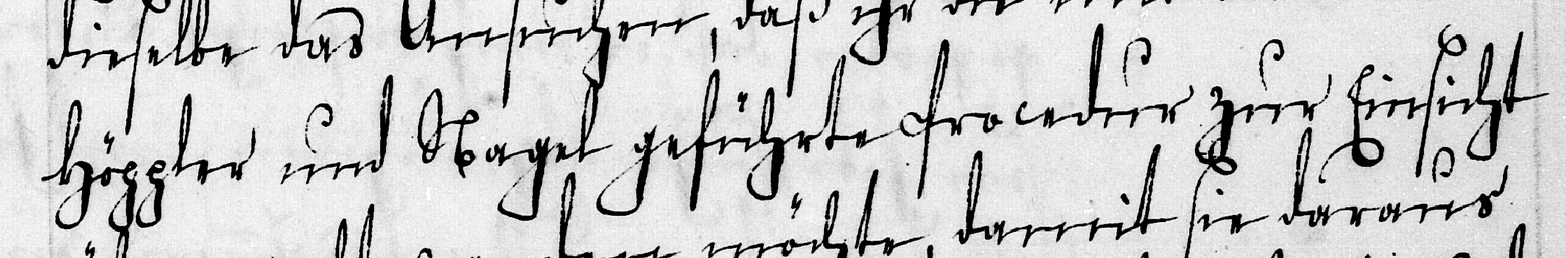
Höppler und Nagel geführte Procedur zur Einsicht
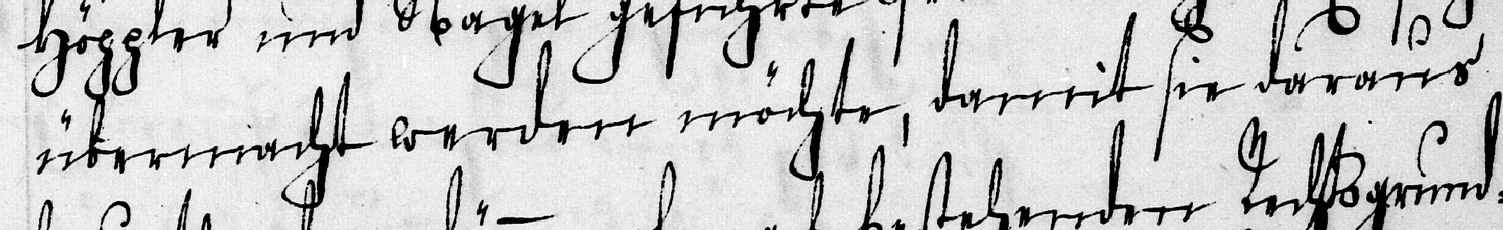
übermacht werden möchte, damit sie daraus
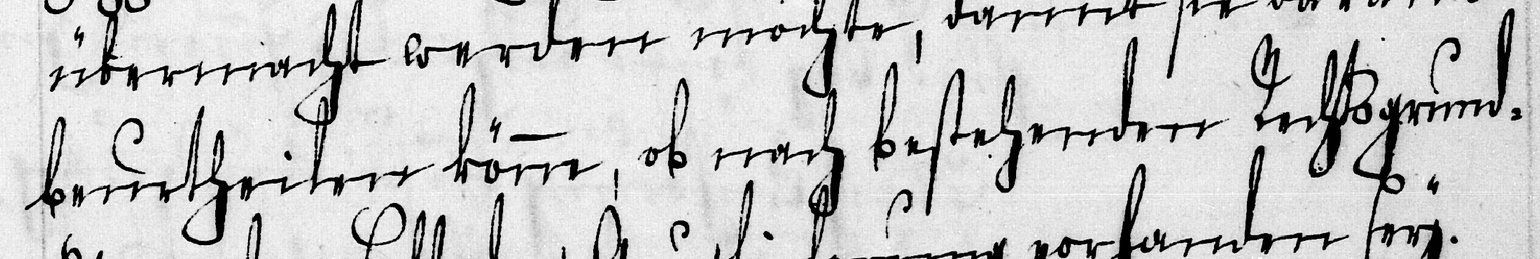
beurtheilen könne, ob nach bestehenden Rechtsgrund¬
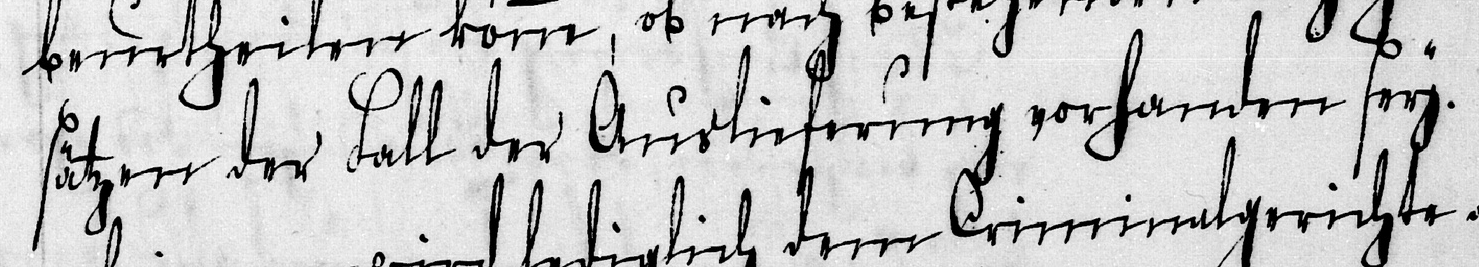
sätzen der Fall der Auslieferung vorhanden sey.
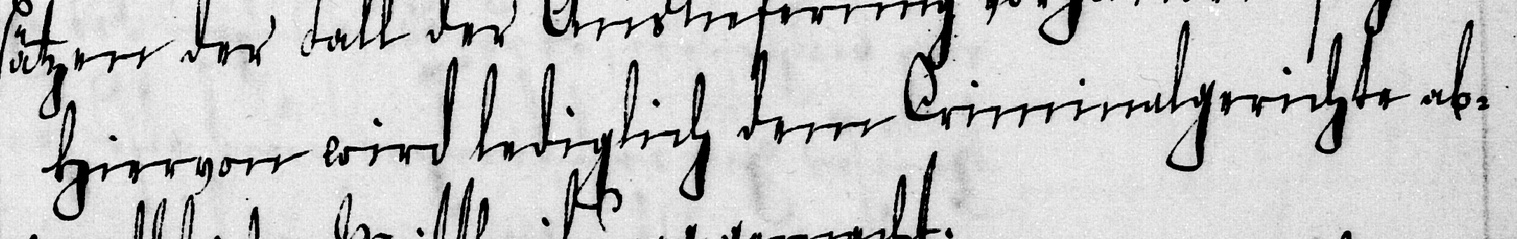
Hiervon wird lediglich dem Criminalgerichte ab¬
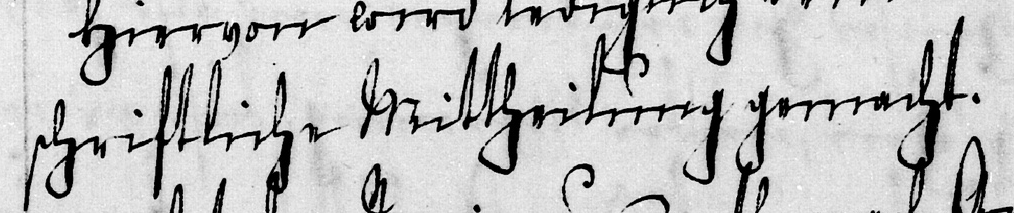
schriftliche Mittheilung gemacht.
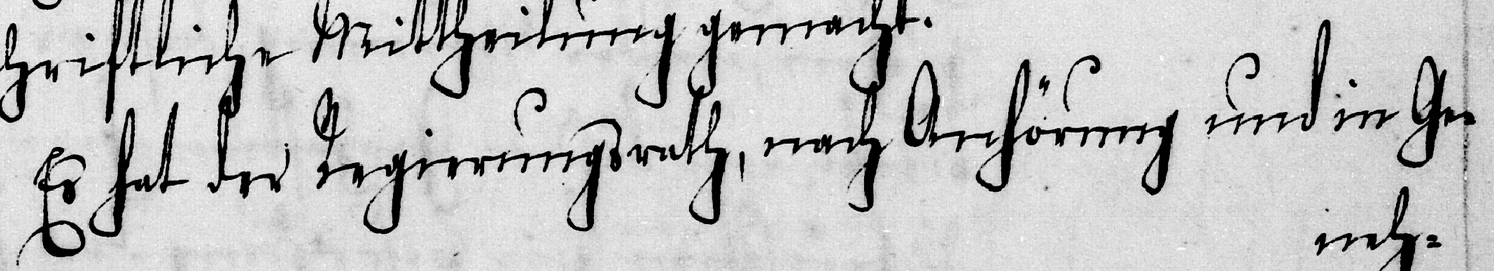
Es hat der Regierungsrath, nach Anhörung und in Ge-
